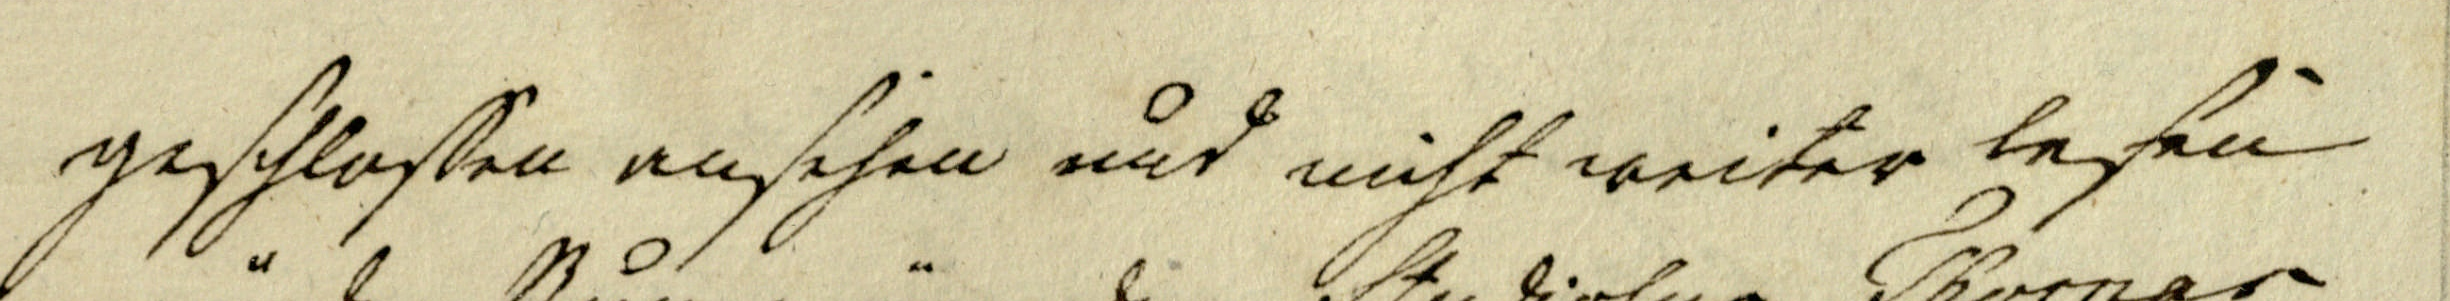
geschlossen ansehen und nicht weiter lesen
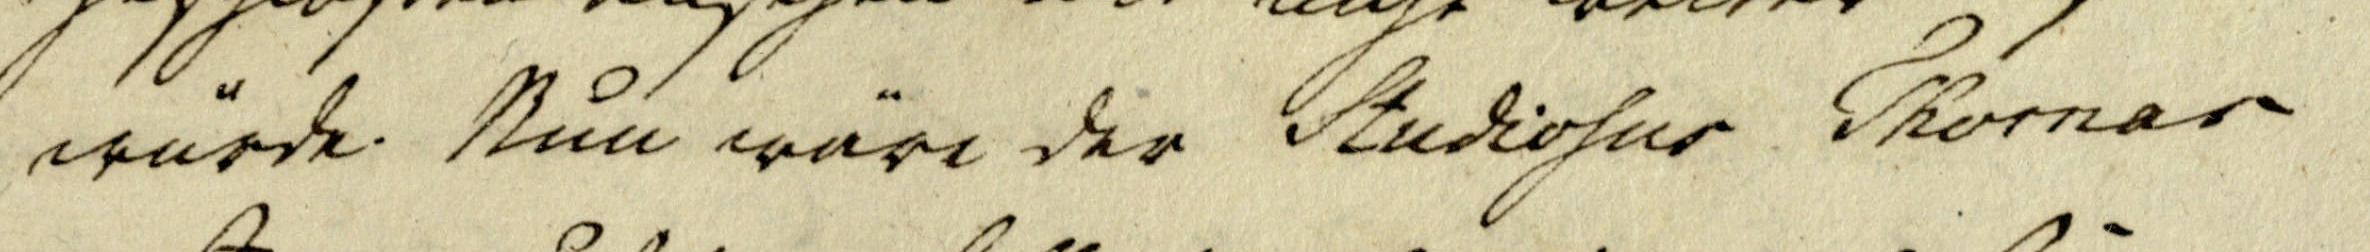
würde. Nun wäre der Studiosus Thomas
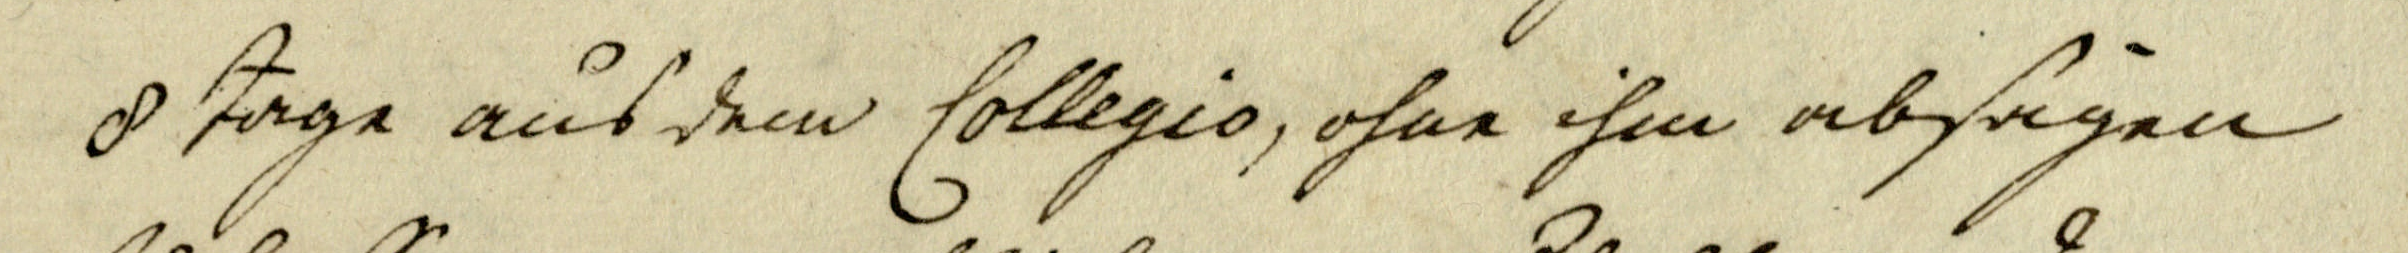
8 Tage aus dem Collegio, ohne ihm absagen
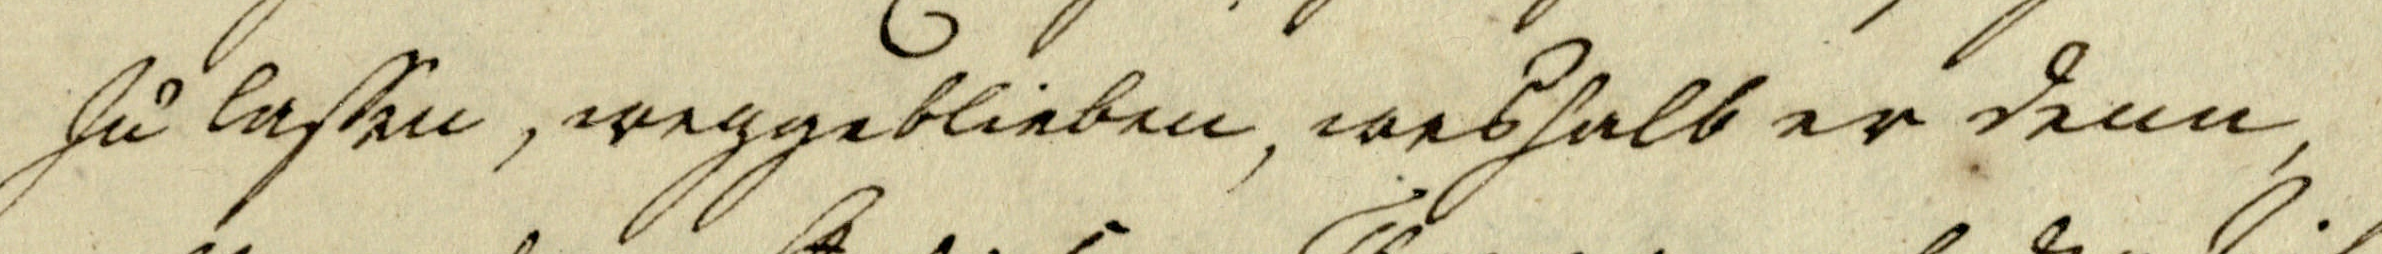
zu lassen, weggeblieben, weshalb er denn
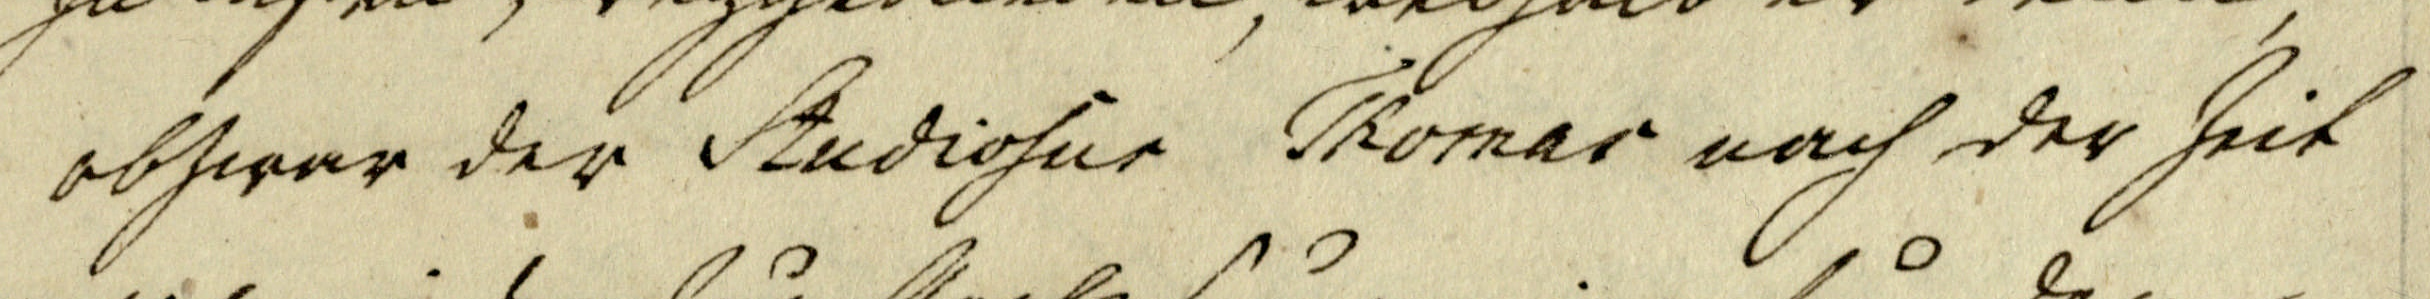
ob zwar der Studiosus Thomas nach der Zeit
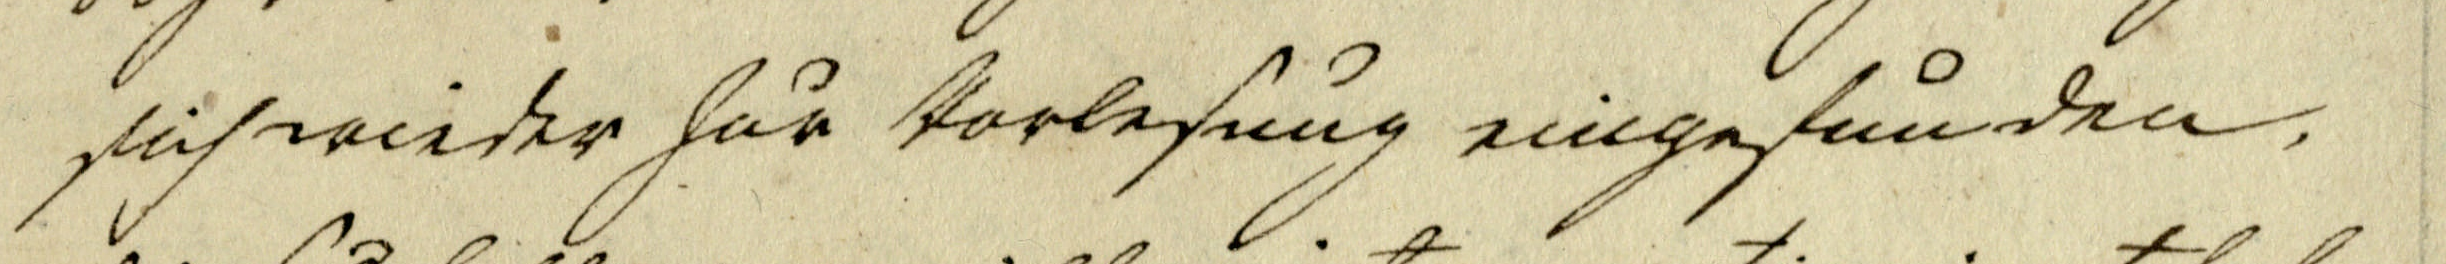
sich wieder zur Vorlesung eingefunden,
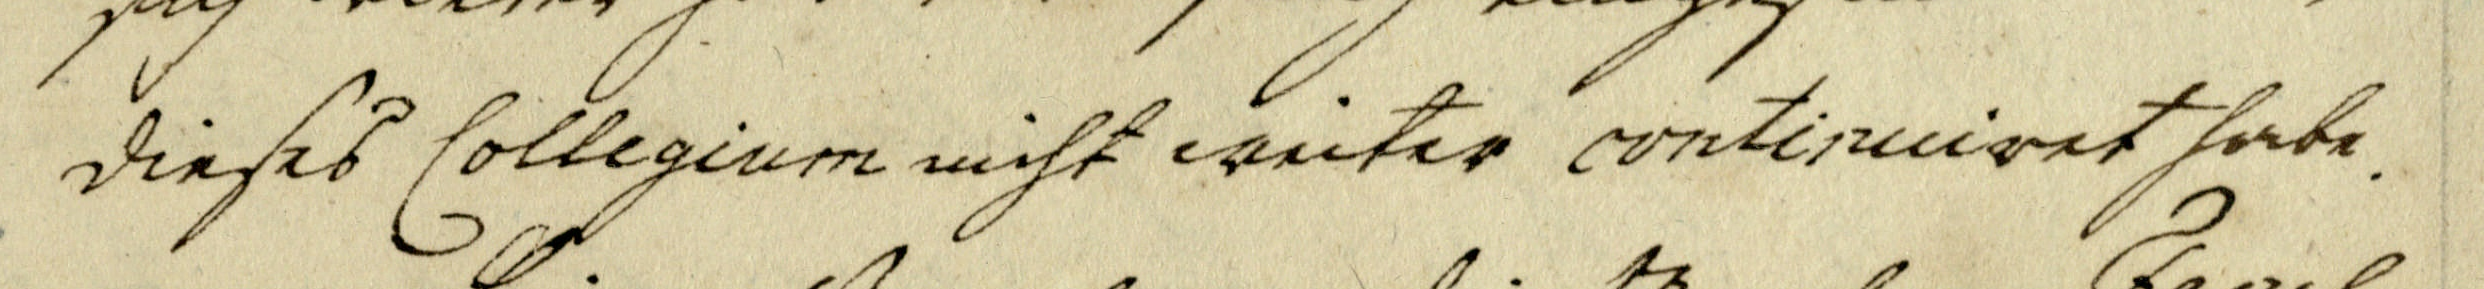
dieses Collegium nicht weiter continuiret habe.
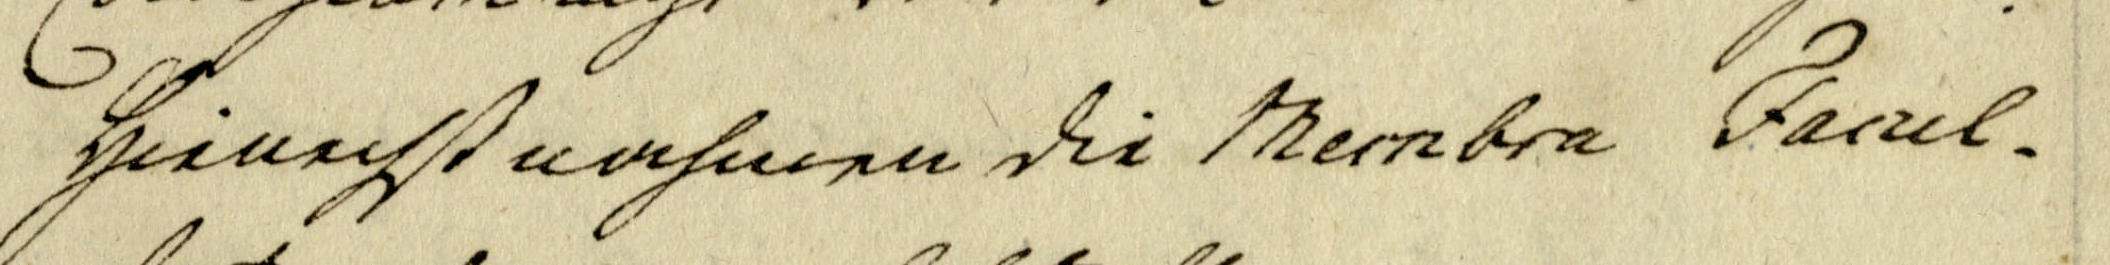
Hienechst nahmen die Membra Facul¬
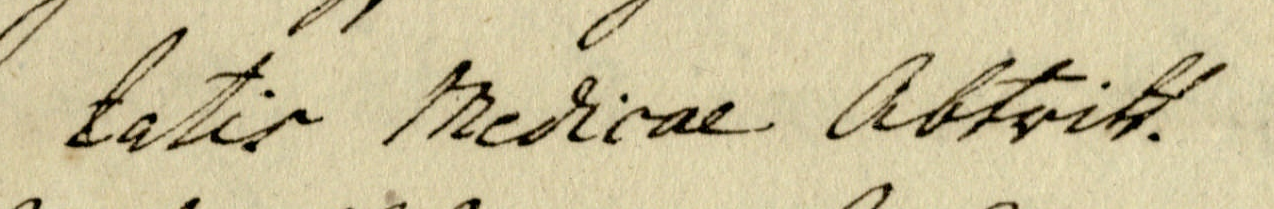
tatis Medica. Abtritt.
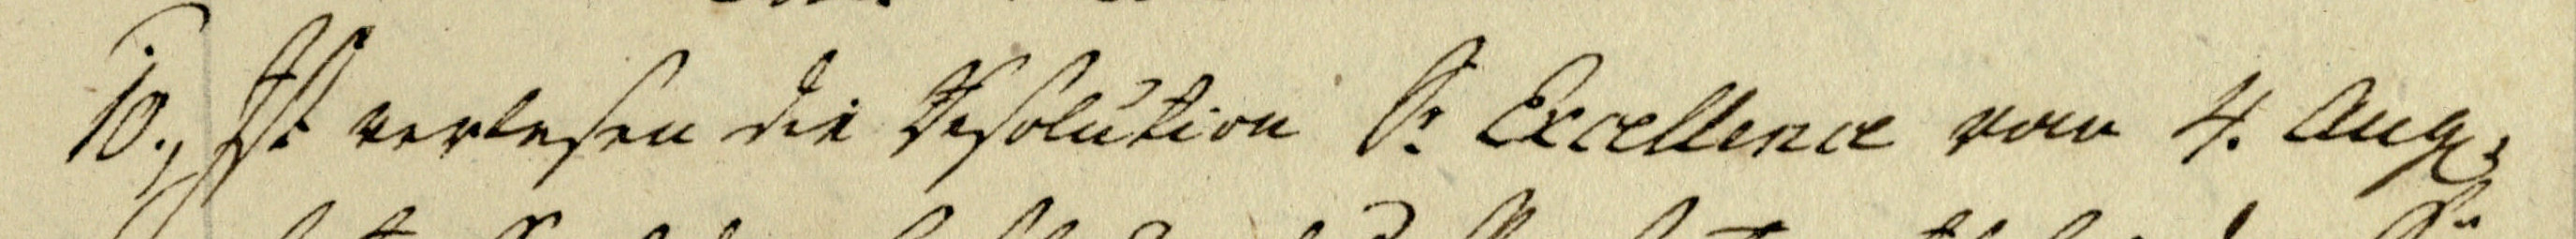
10., Ist verlesen die Resolution Sr Excellence vom 4. Aug.
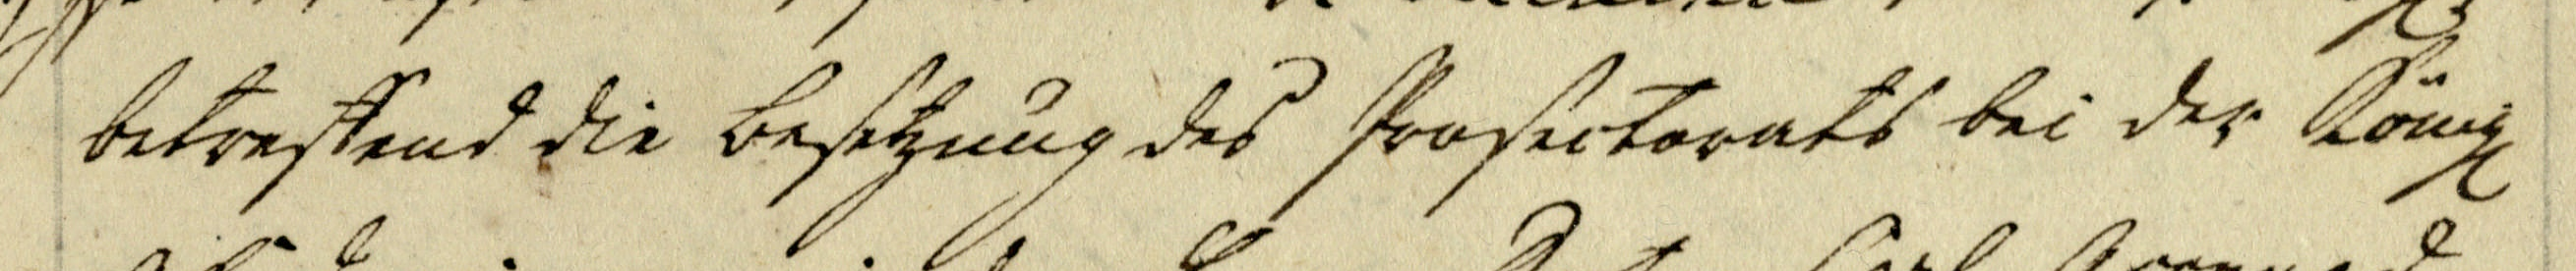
betreffend die Besetzung des Prosectorats bei der Königl.
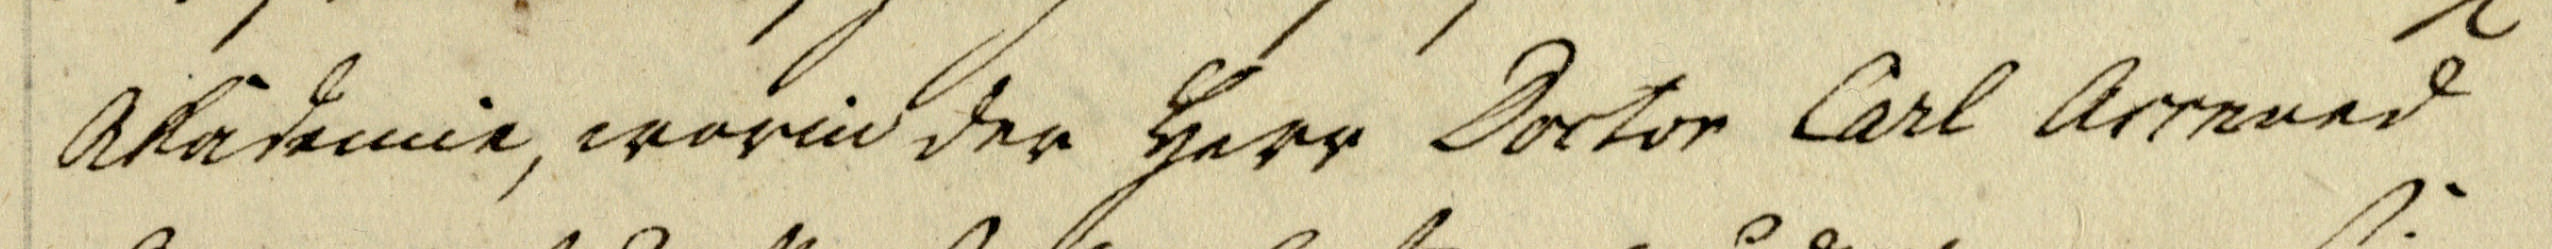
Akademie, worin der Herr Doctor Carl Asmund
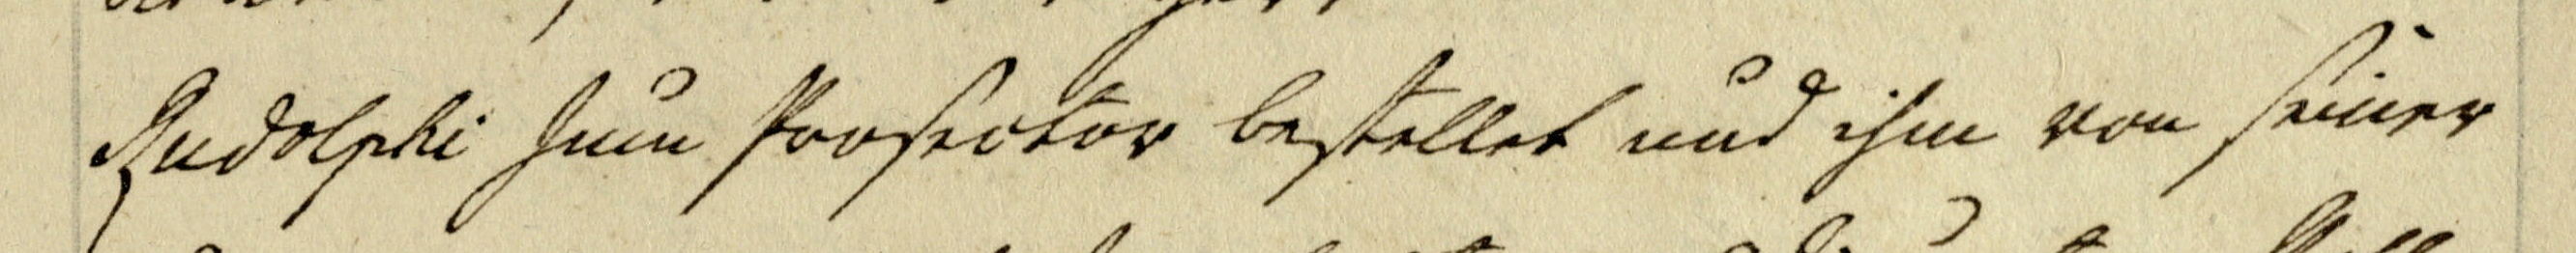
Rudolphi zum Prosector bestellet und ihm von seiner
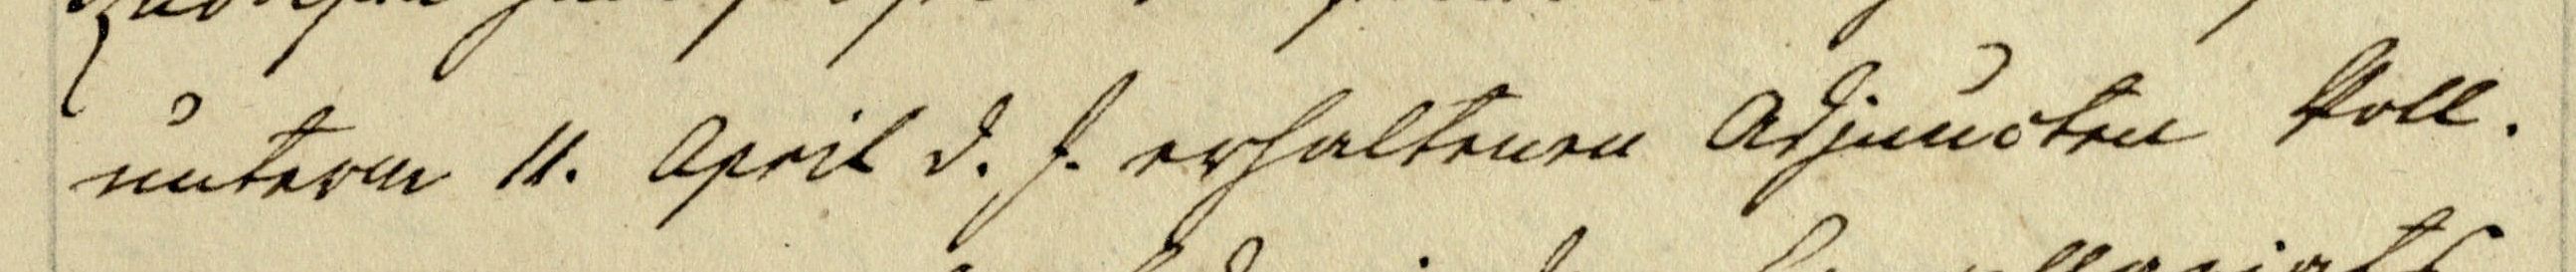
unterm 11. April d. J. erhaltenen Adjuncten Voll¬
